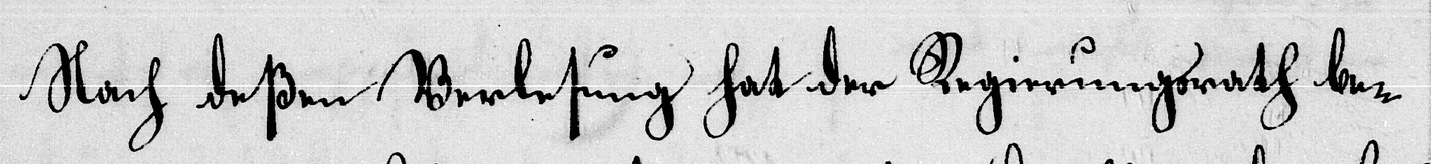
Nach deßen Verlesung hat der Regierungsrath be¬
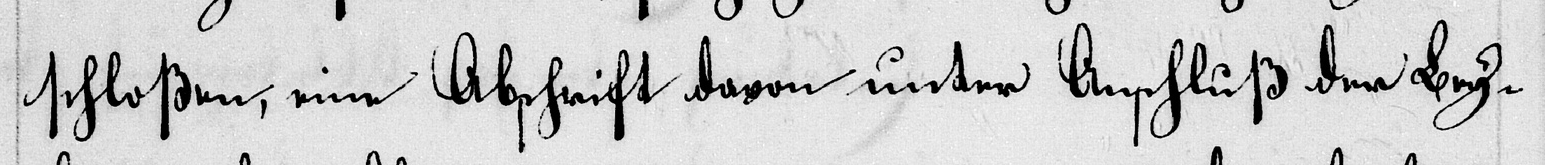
schloßen, eine Abschrift davon unter Anschluß der Bey¬
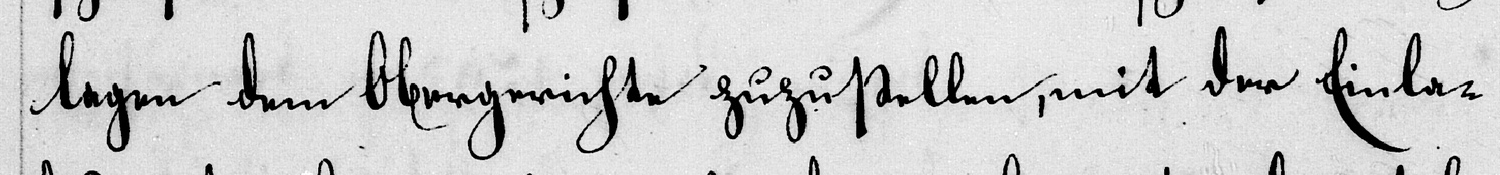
lagen dem Obergerichte zuzustellen, mit der Einla¬
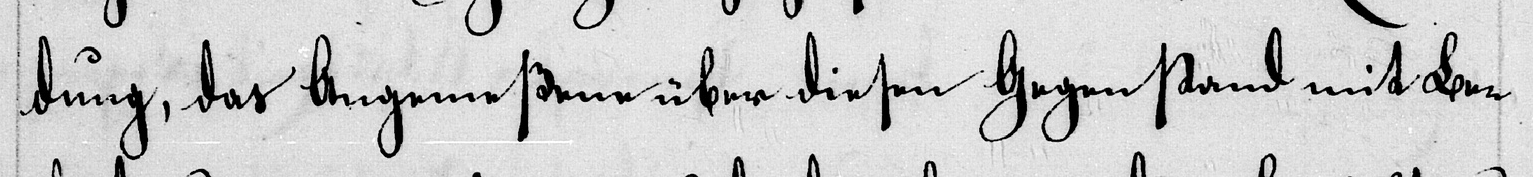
dung, das Angemeßene über diesen Gegenstand mit Be¬
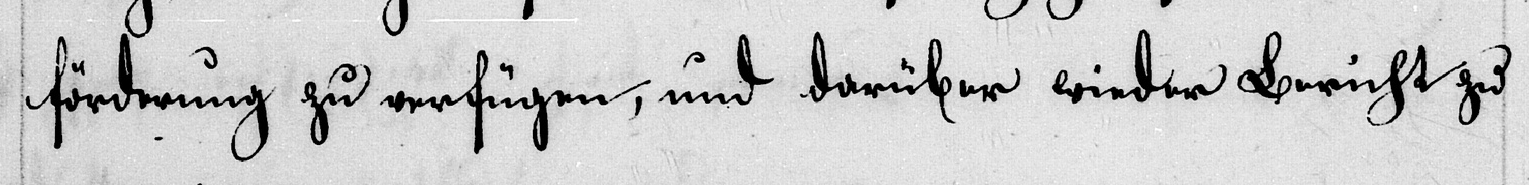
förderung zu verfügen, und darüber wieder Bericht zu
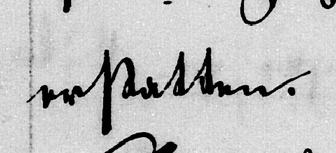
erstatten.
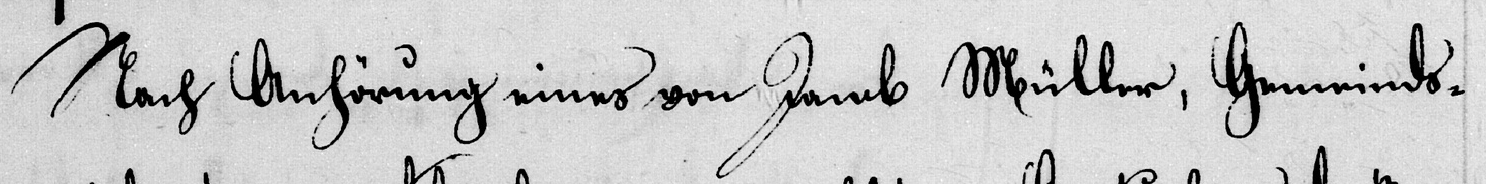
Nach Anhörung eines von Jacob Müller, Gemeinds¬
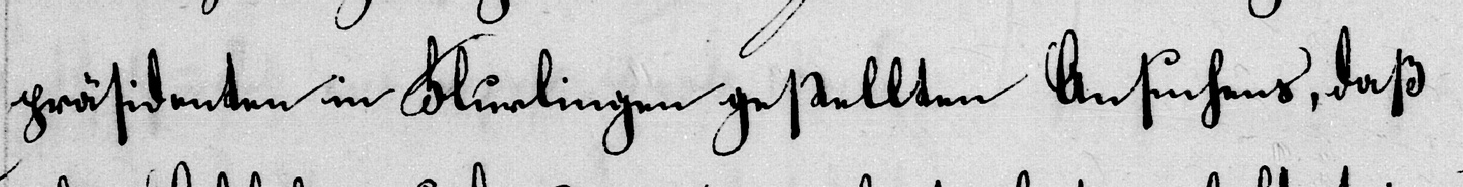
präsidenten in Flurlingen gestellten Ansuchens, daß
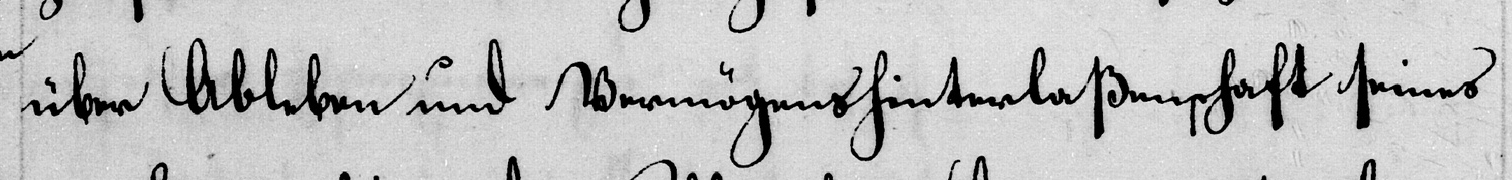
über Ableben und Vermögenshinterlaßenschaft seines
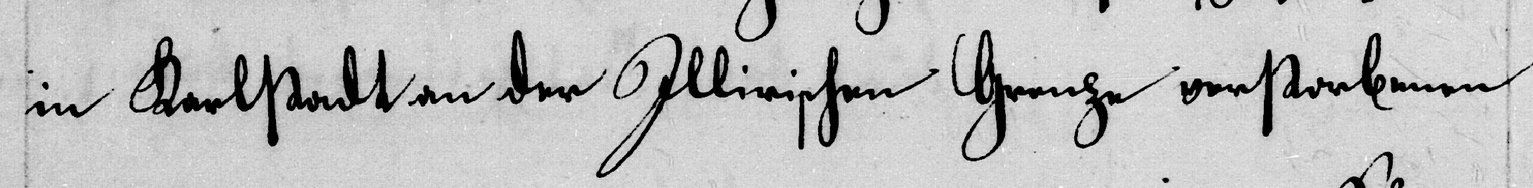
in Karlstadt an der Illirischen Grenze verstorbenen
